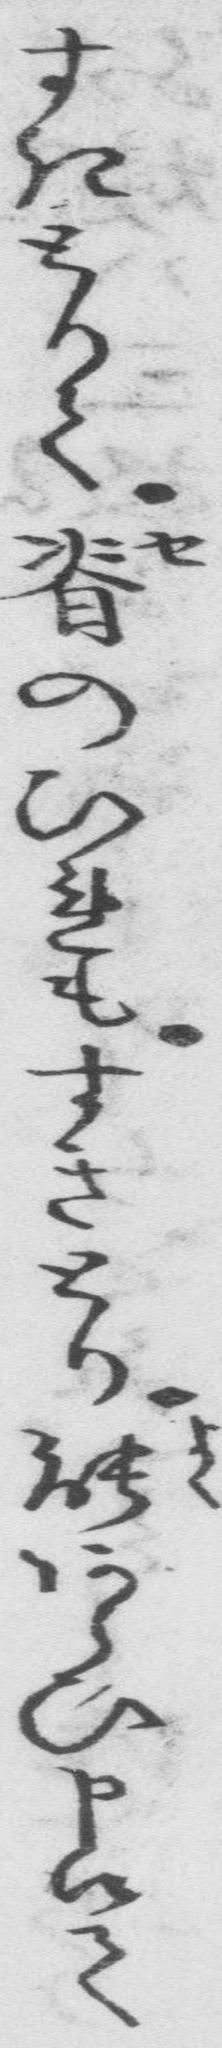すきとりて。背のひれも。すきとり。能あらひ申候て
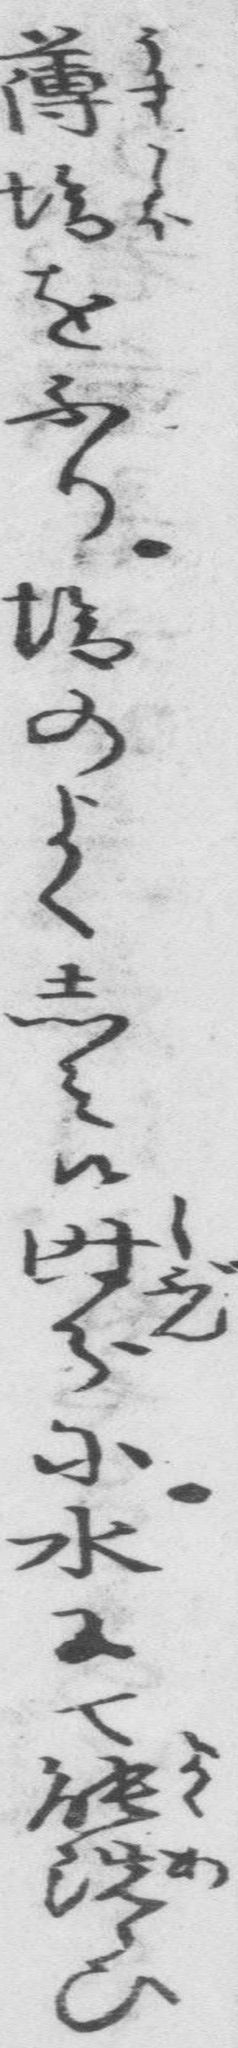薄塩をふり。塩のよくしみ候時分に。水にて能洗らひ
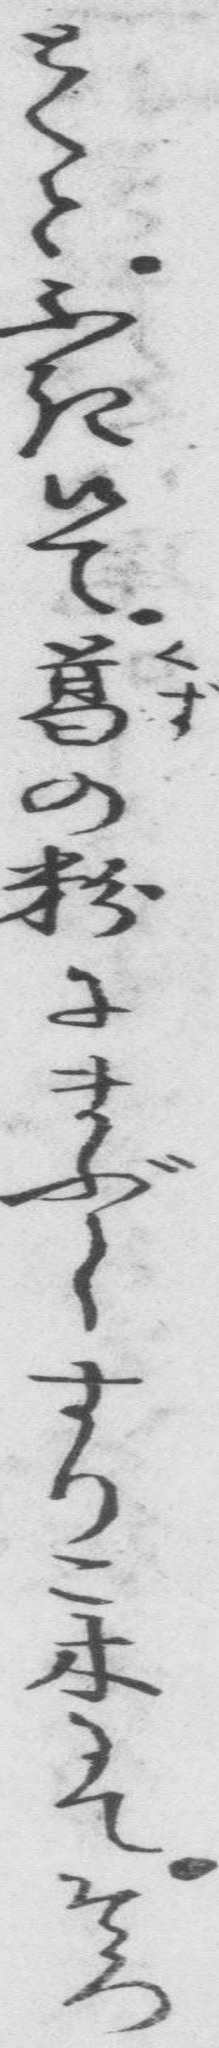とくと。ふき候て。葛の粉にまぶしすりこ木にて。そろ
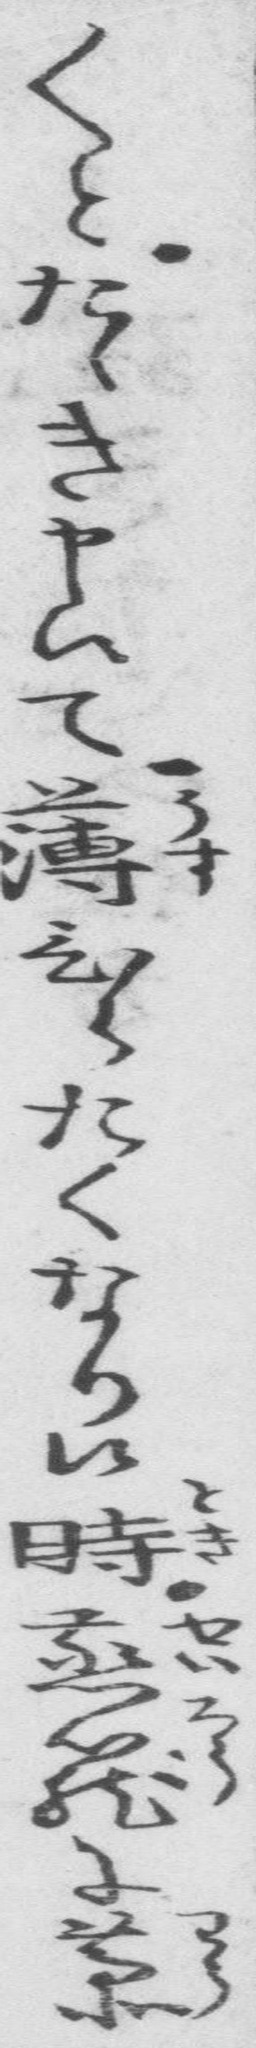〳〵と。たゝき申候て。薄ひらたくなり候時。蒸籠に藁
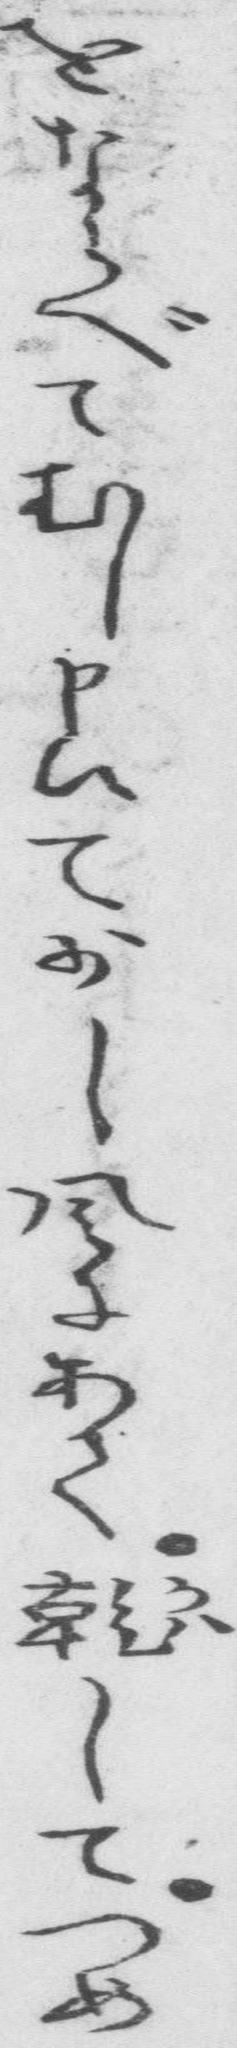をならべてむし申候て少し風にあて。乾かして。つめ
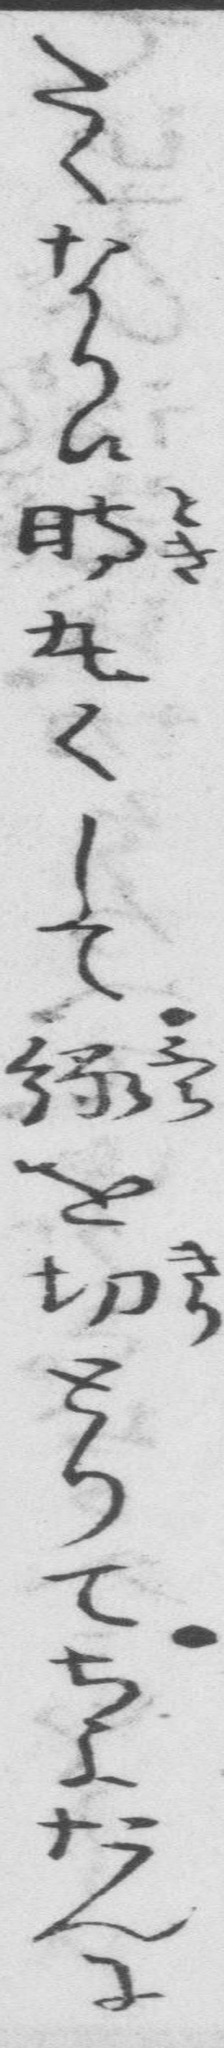たくなり候時丸くして。縁を切とりて。ちよたんに
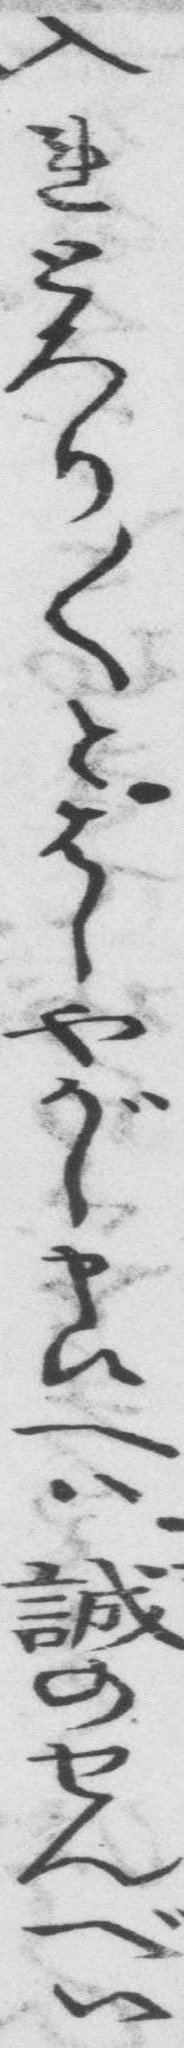入れとろり〳〵と。はしやがし申候へは。誠のせんべい
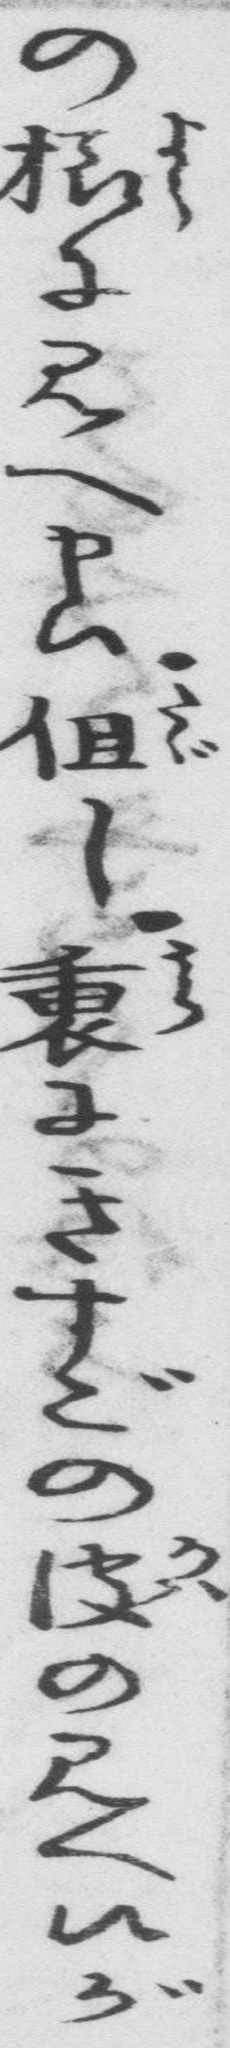の様子見へ申候。但し。裏にきすごの皮の見へ候が
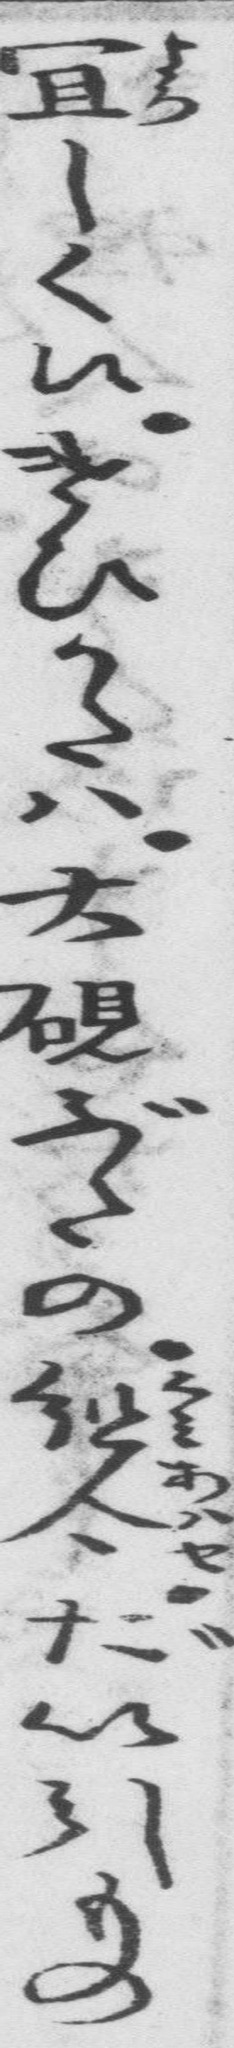宜しく候。遣ひかたは。大硯ぶたの。組合。だい引もの
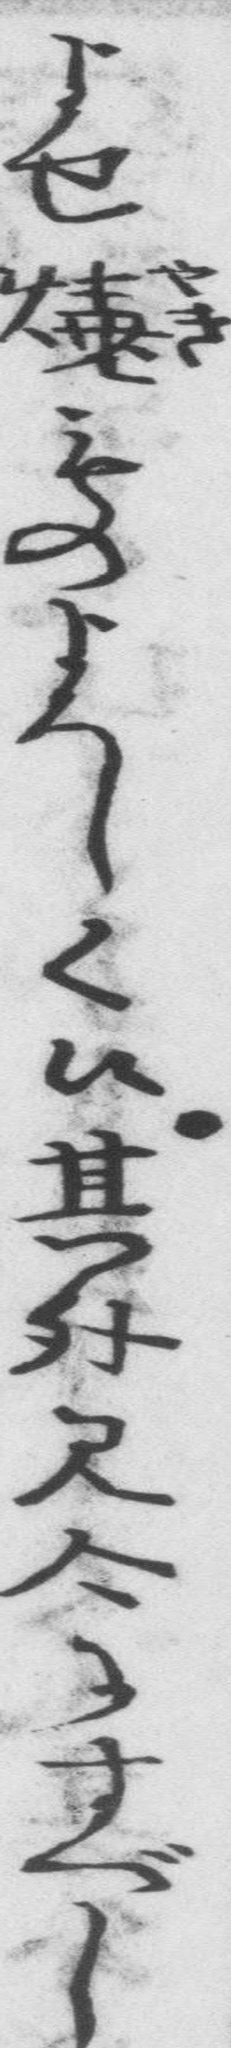よせ焼ものよろしく候。其外見合にすべし
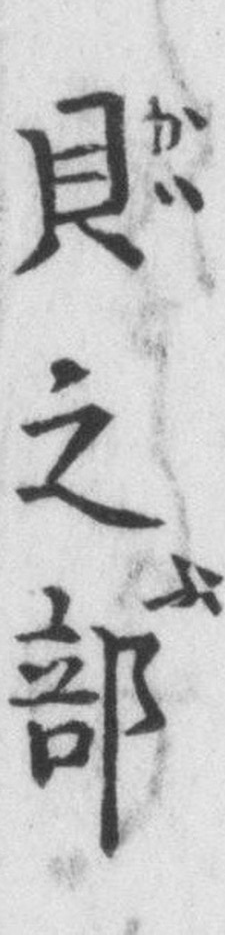貝の部
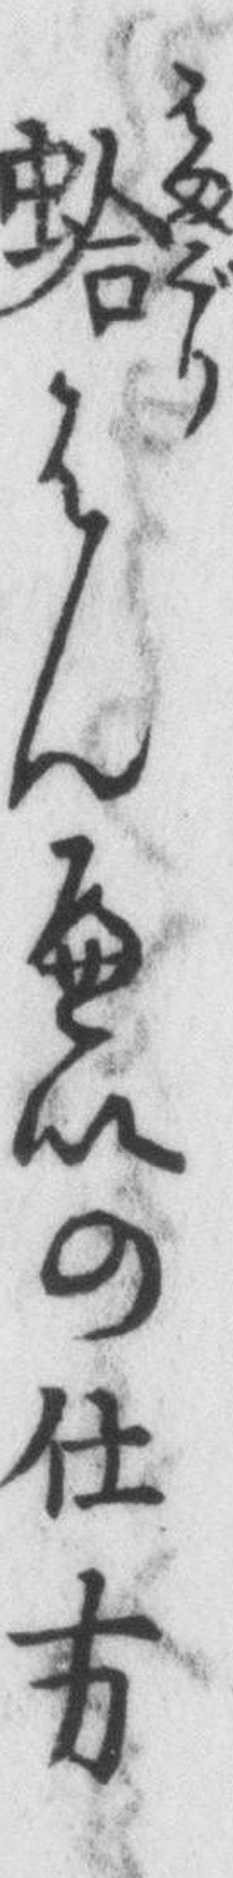蛤はんへいの仕方
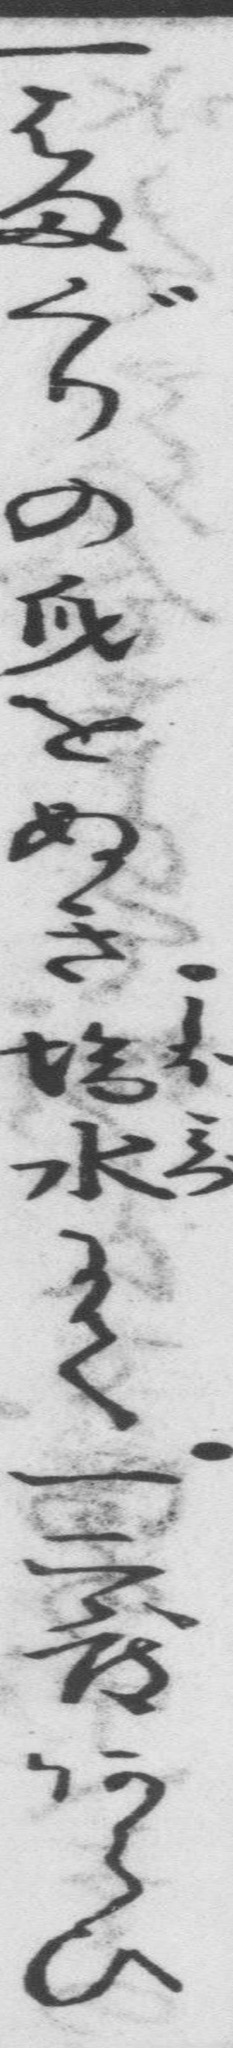一はまぐりの身をぬき。塩水にて。一二度あらひ
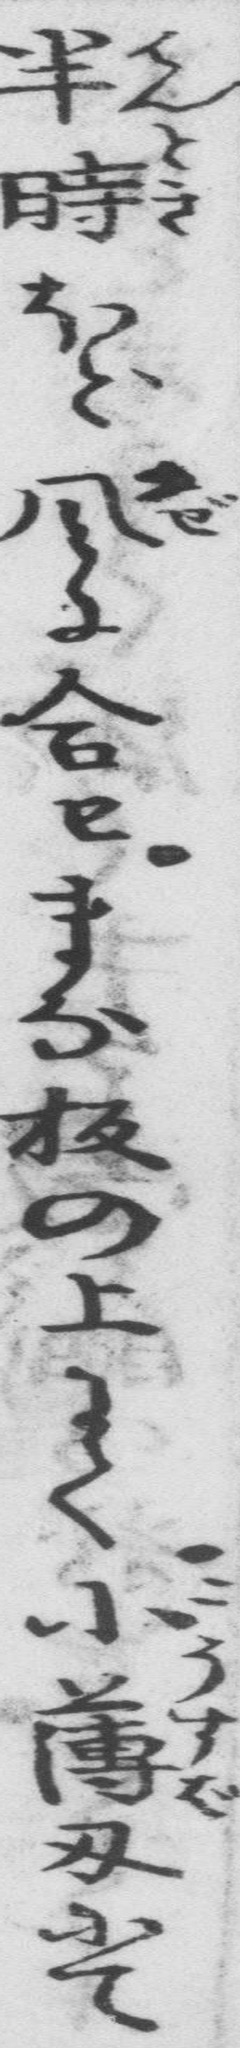半時ほど風に合せ。まな板の上にて。小薄刃にて
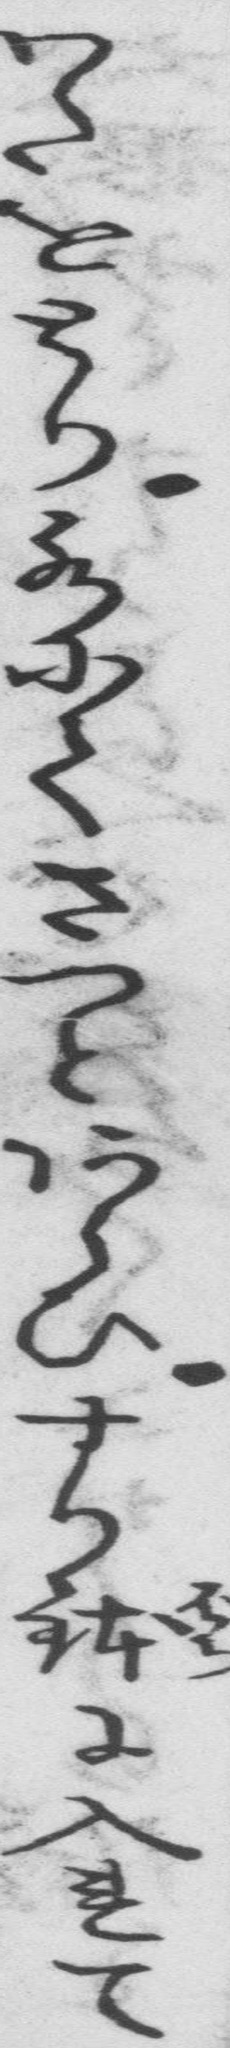わたをとり。水にてさつとあらひ。すり鉢に入れて

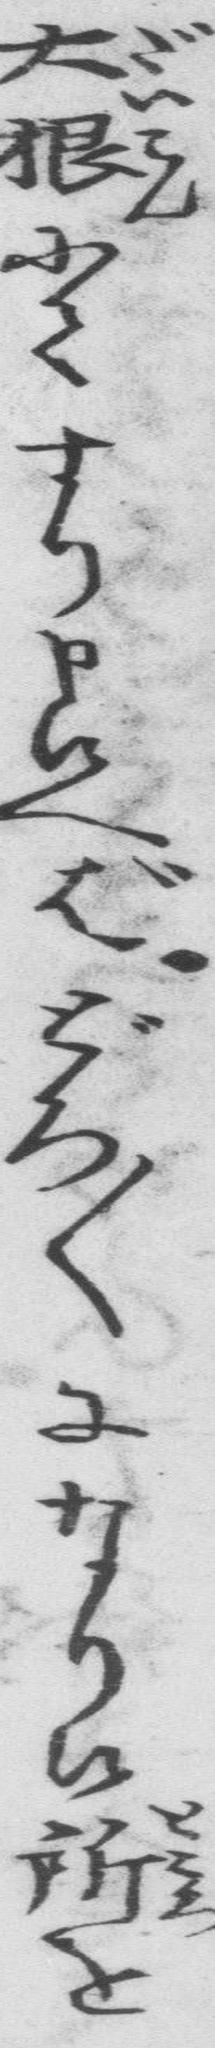大根にてすり申候へば。どろ〳〵になり候所を
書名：萬寳料理秘密箱
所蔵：大阪府立大学学術情報センター 国文学研究資料館
